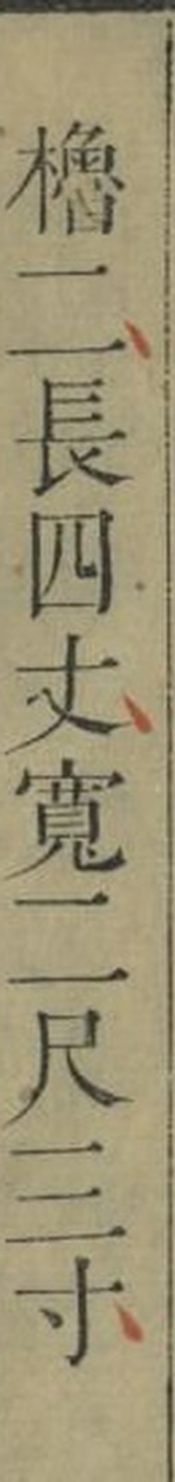櫓二長四丈寬二尺三寸
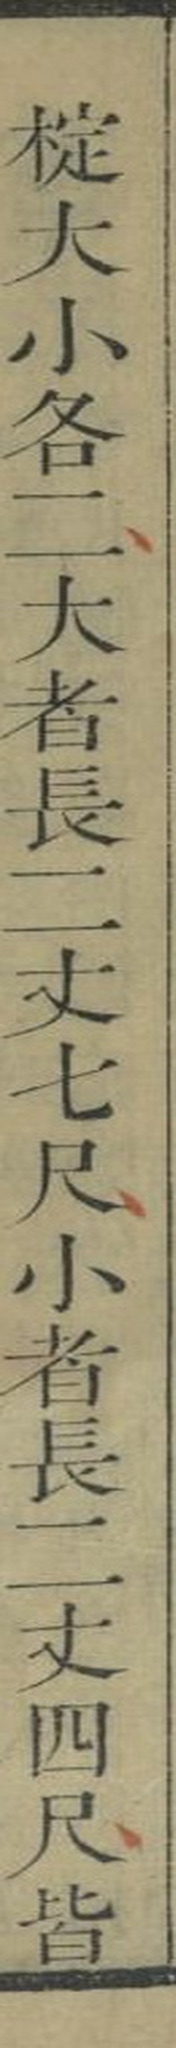椗大小各二大者長二丈七尺小者長二丈四尺皆
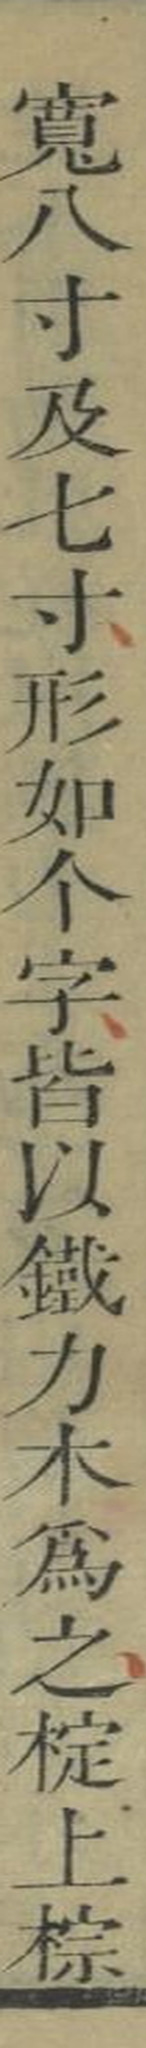寬八寸及七寸形如个字皆以鐵力木爲之椗上棕
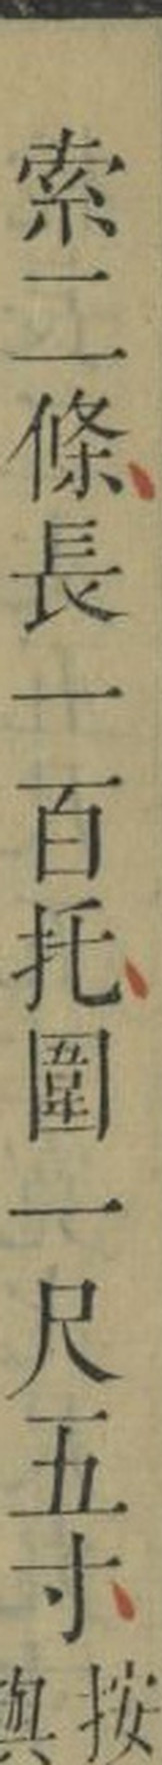繚母索二條長一十五托圍一尺五寸
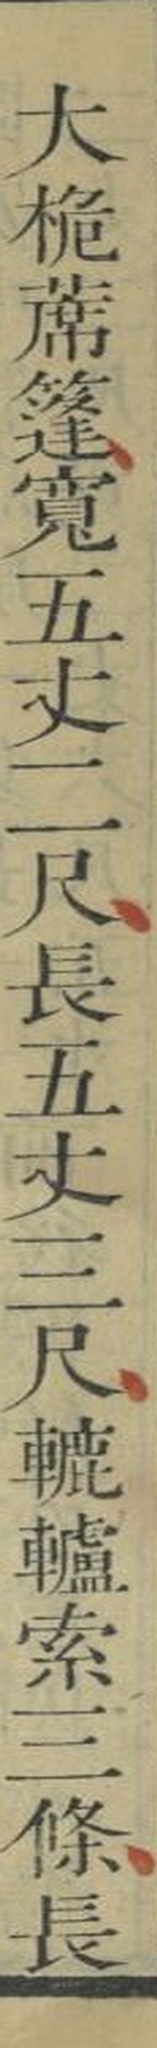大桅蓆篷寬五丈二尺長五丈三尺轆轤索三條長
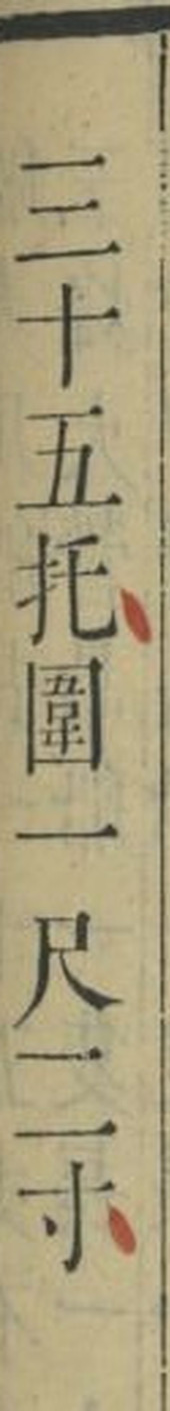三十五托圍一尺二寸
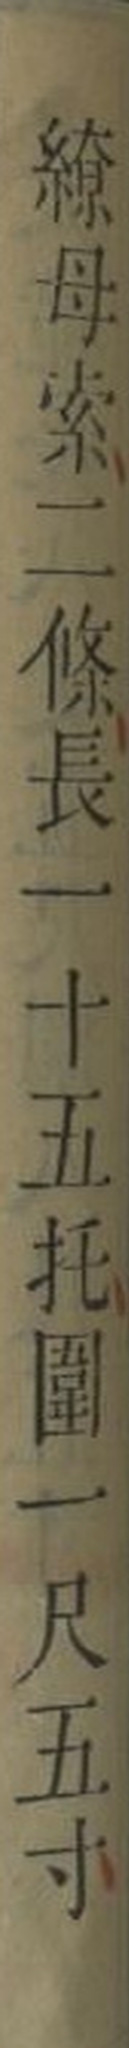繚母索二條長一十五托圍一尺五寸
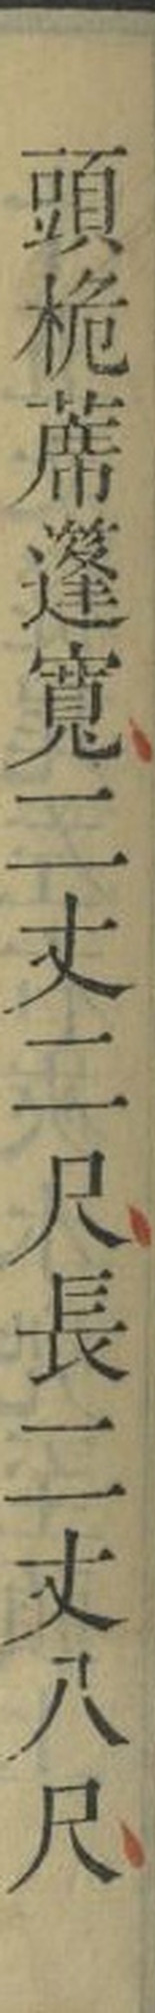頭桅蓆篷寬二丈二尺長二丈八尺
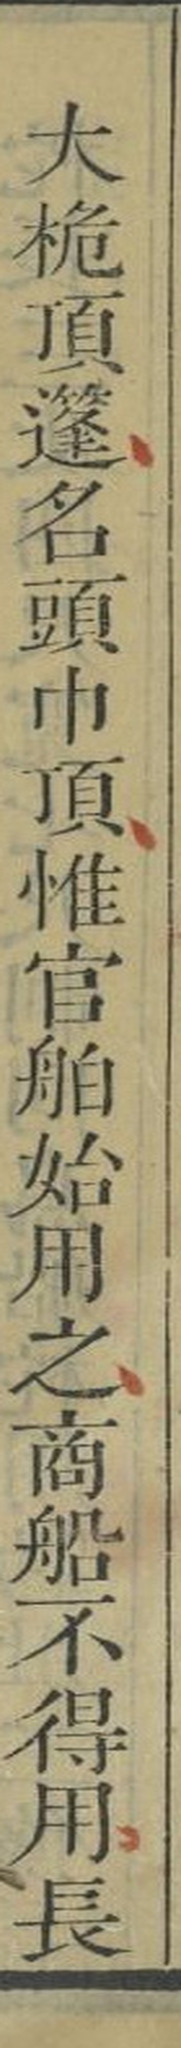大桅頂篷名頭巾頂惟官舶始用之商船不得用長
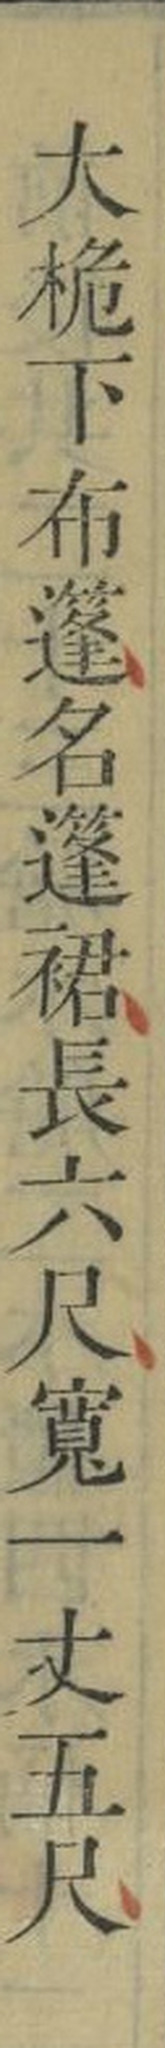大桅下布篷名篷裙長六尺寬一丈五尺
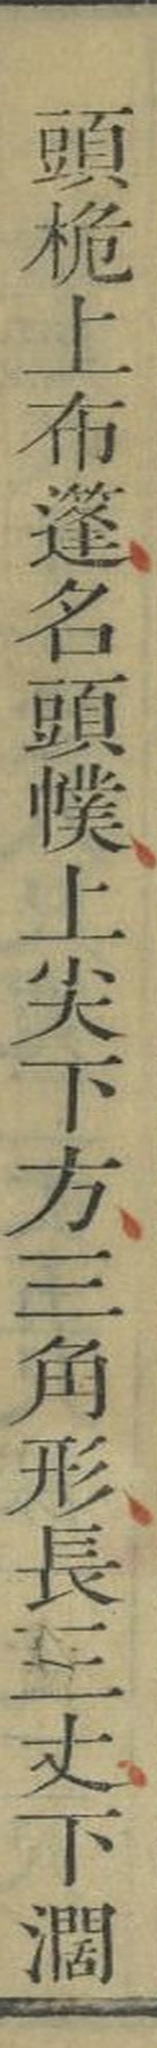頭桅上布篷名頭幞上尖下方三角形長三丈下濶
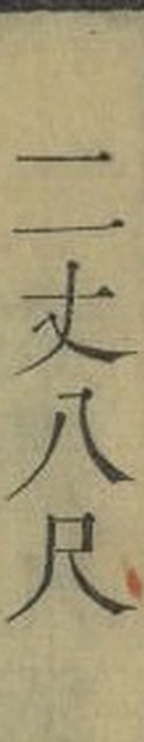二丈八尺
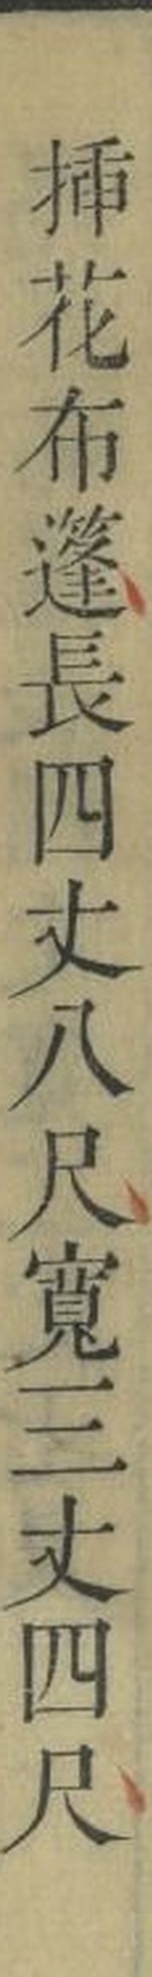揷花布篷長四丈八尺寬三丈四尺
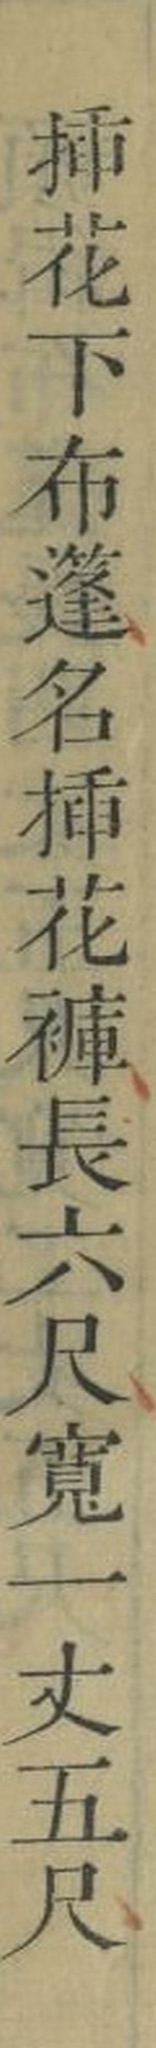揷花下布篷名揷花褲長六尺寬一丈五尺

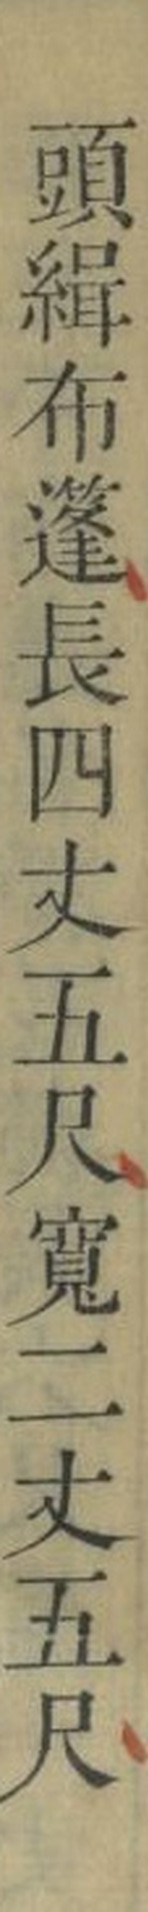頭緝布篷長四丈五尺寬二丈五尺
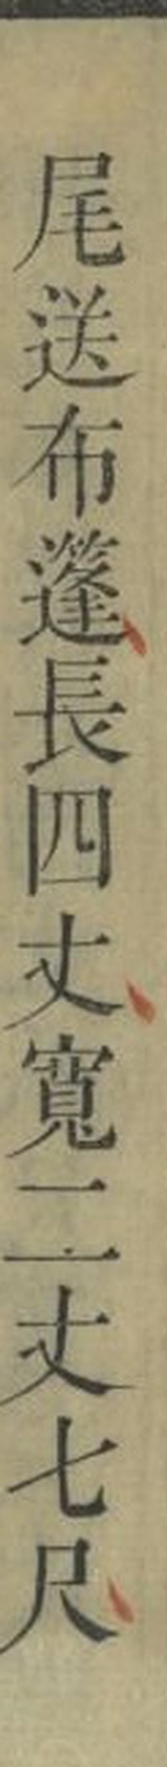尾送布篷長四丈寬二丈七尺
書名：中山伝信録 巻一、巻二
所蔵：University of the Ryukyus Library
